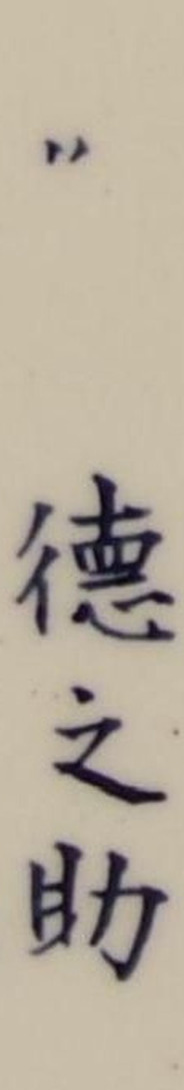徳之助
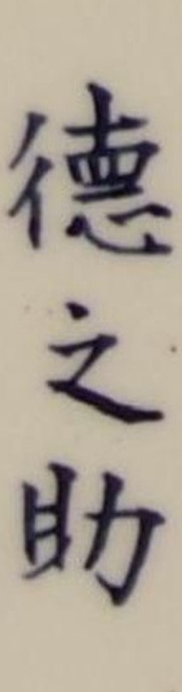徳之助
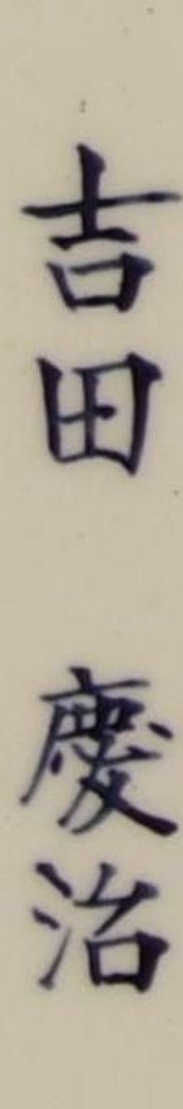吉田慶治

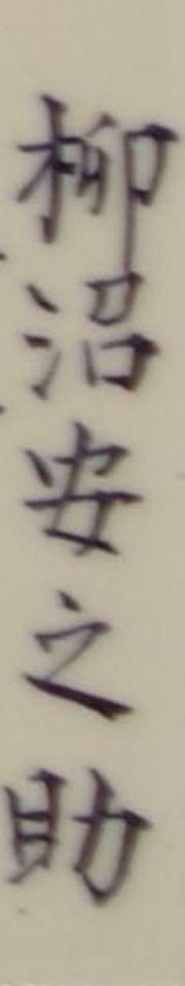柳沼安之助
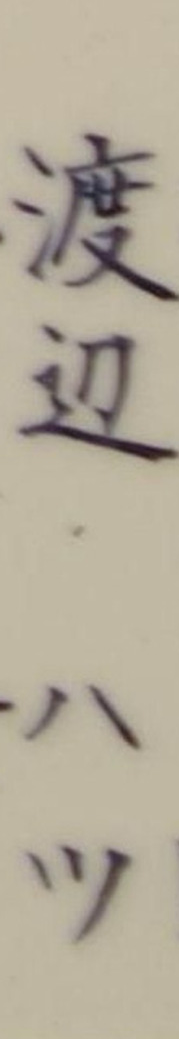渡辺ハツ
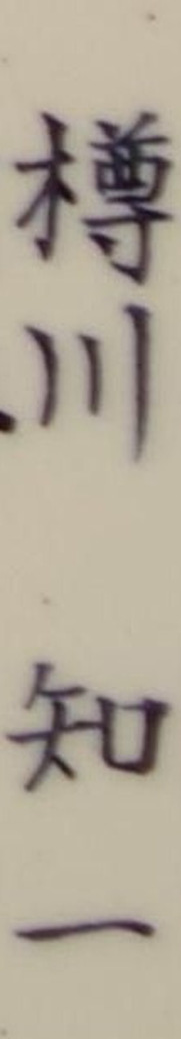樽川知一
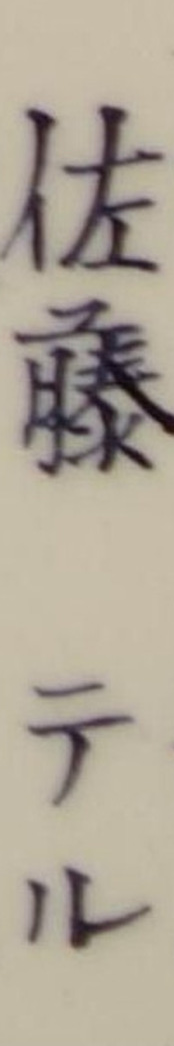佐藤テル
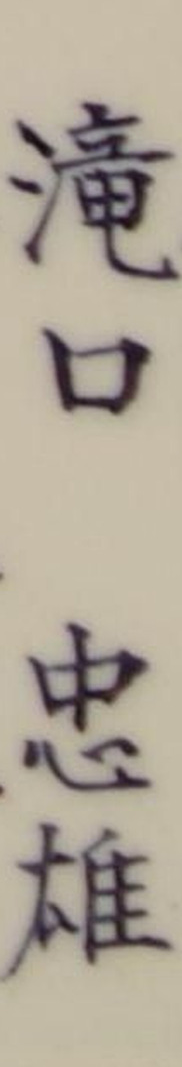滝口忠雄
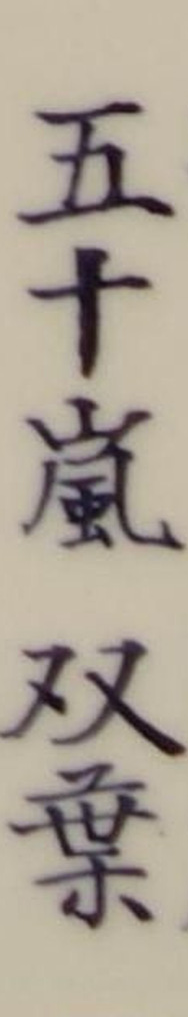五十嵐双葉
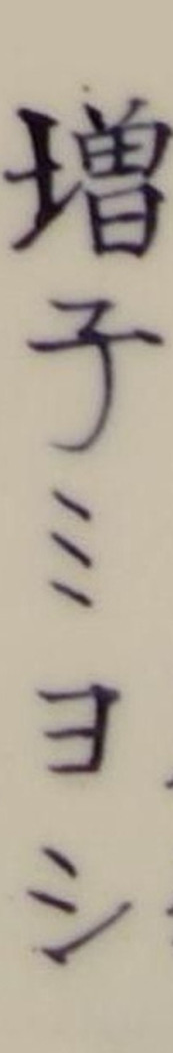増子ミヨシ
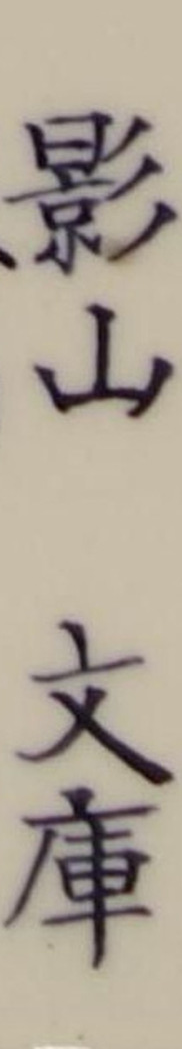影山文庫
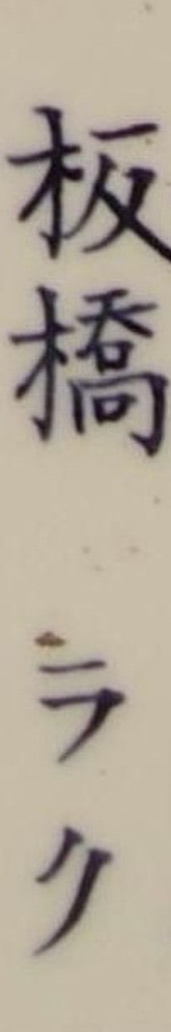板橋ラク
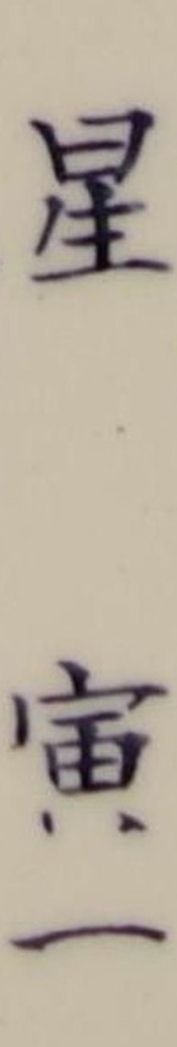星寅一
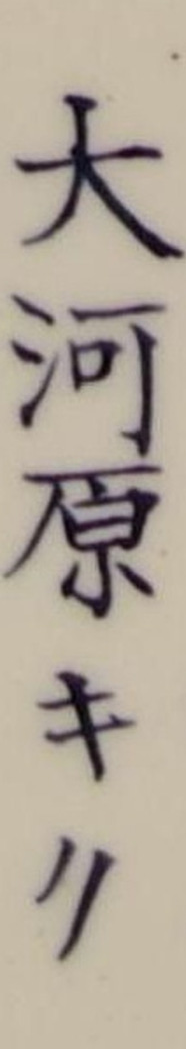大河原キク
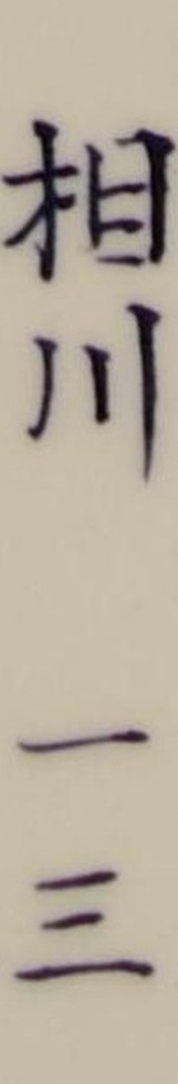相川一三
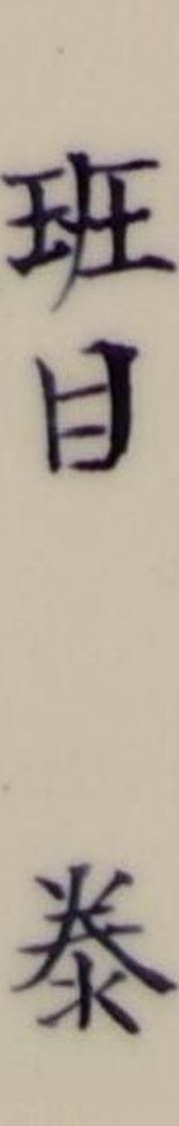班日泰
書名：E~L
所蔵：高野山金剛峯寺
